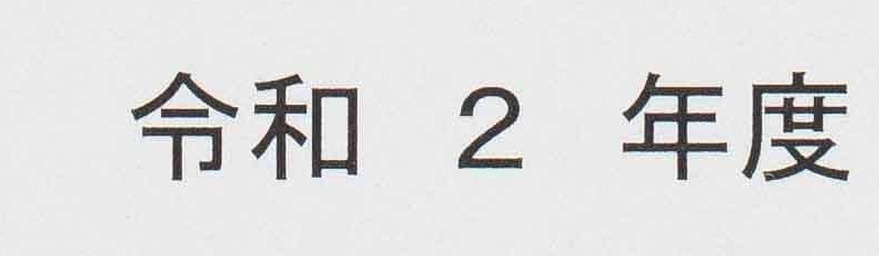令和２年度
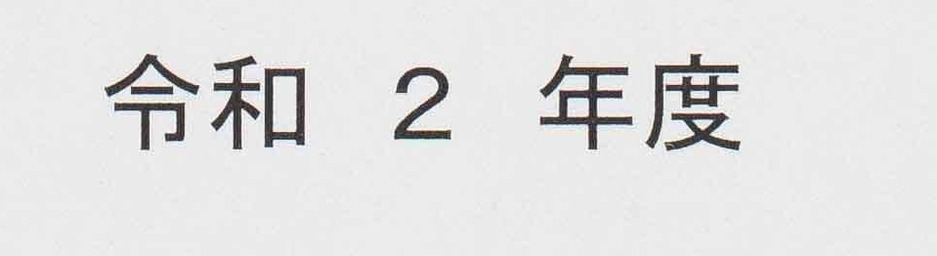令和２年度
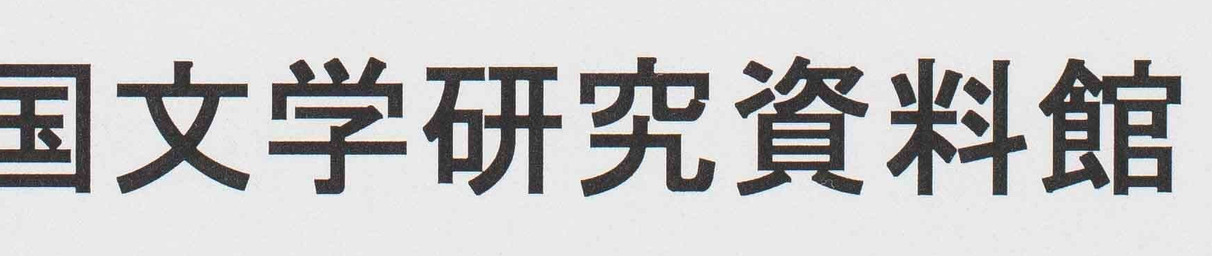国文学研究資料館

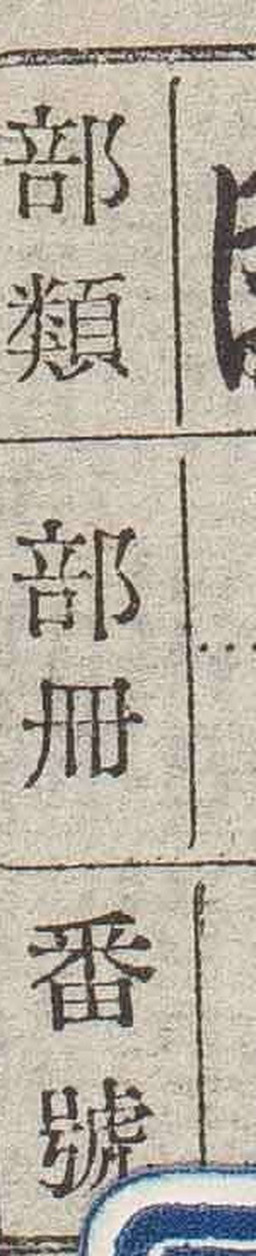部類部冊番号

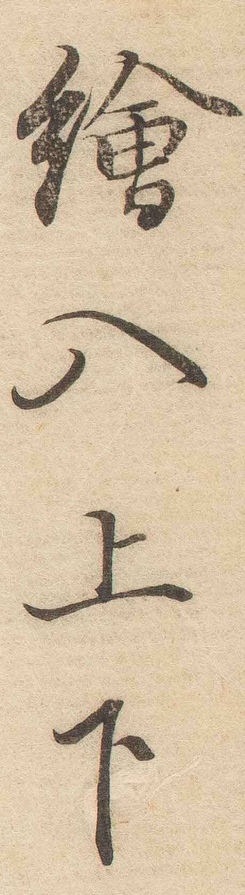絵入上下
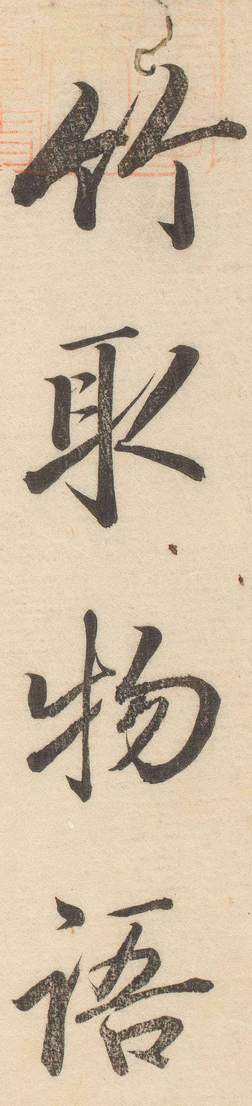竹取物語
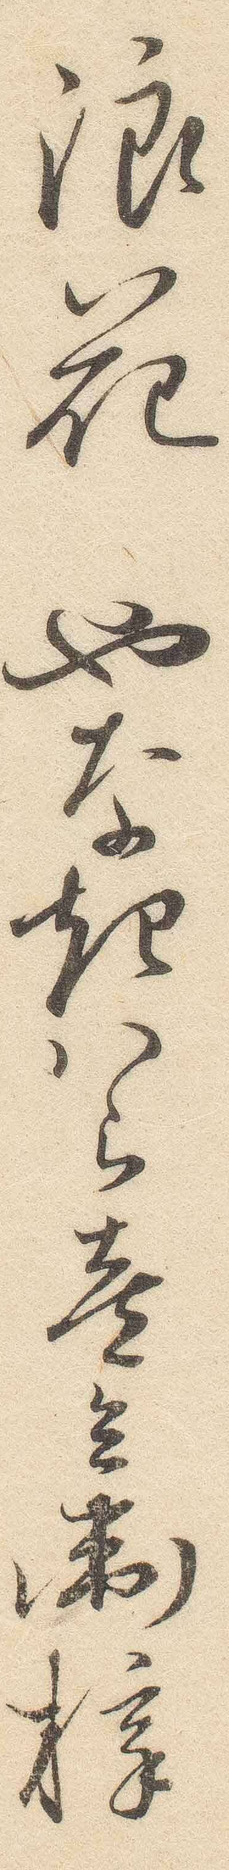浪花やなきはら壱兵衛梓
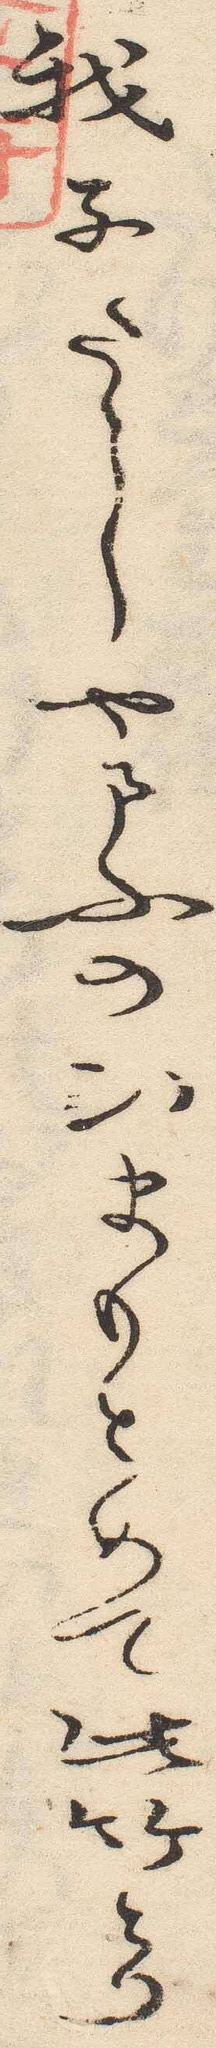我子たゝしやまふのひまもとめて此竹とり
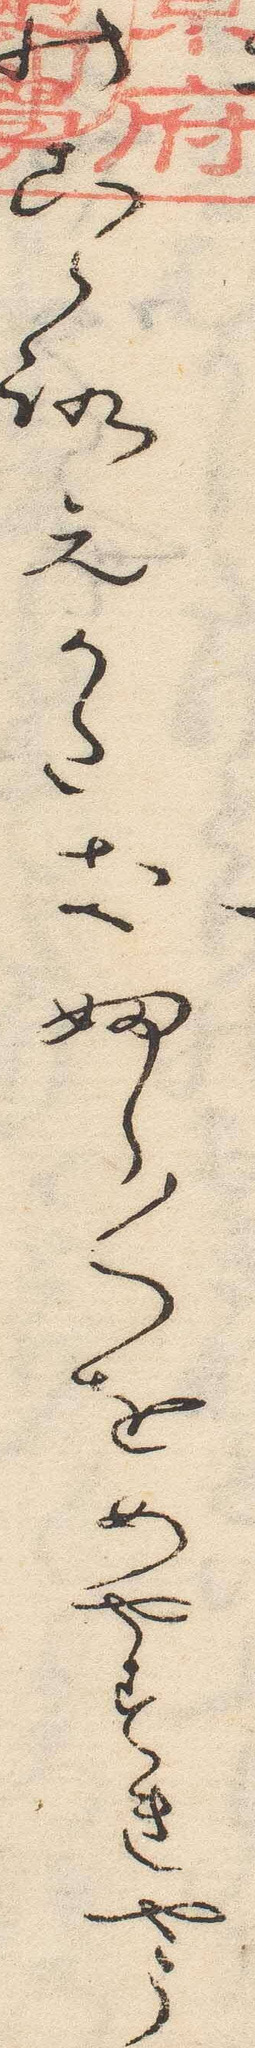のこゝろえかたきふし〳〵をめやすきやう
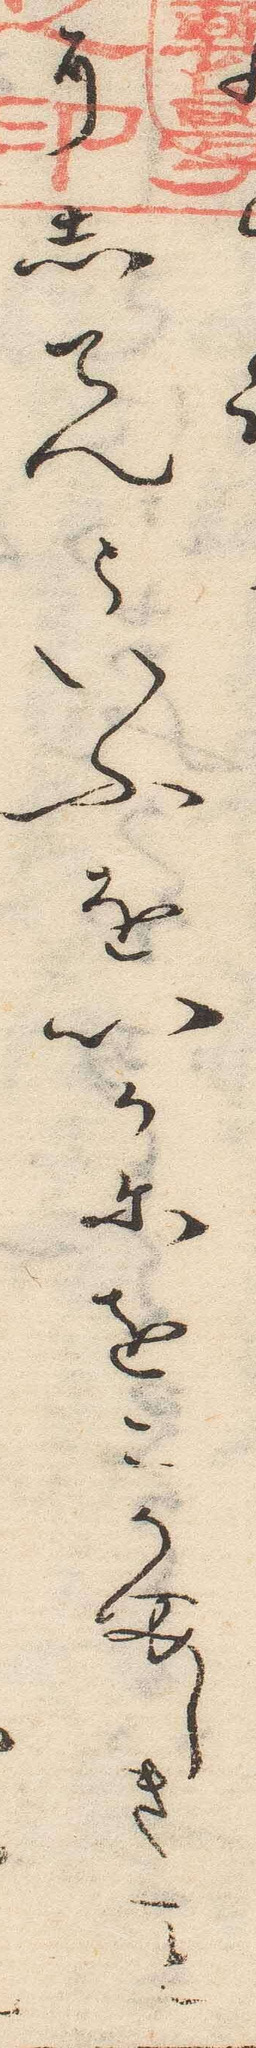にしてんといふをいかにをこかましきこと
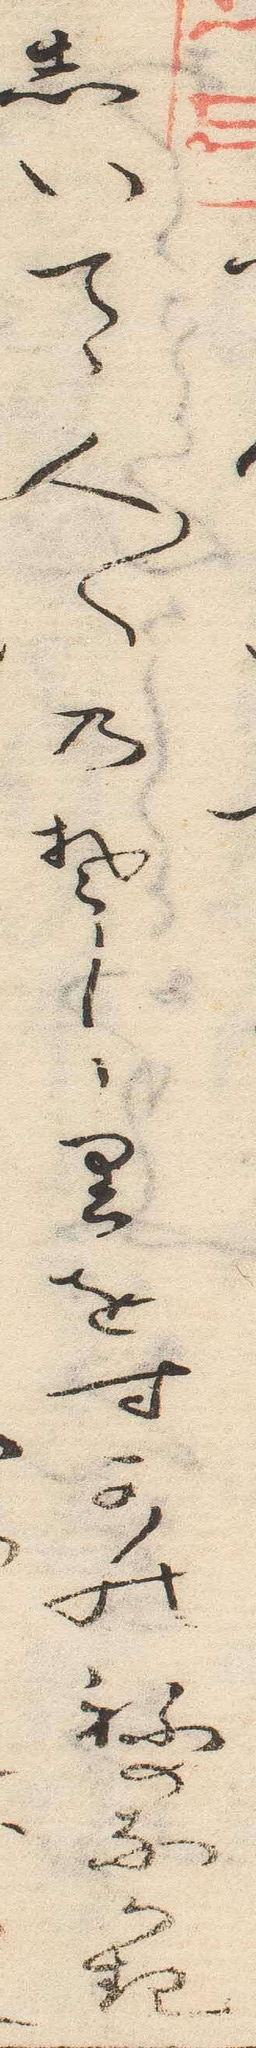しいてゝ人々のそしりをすかのねのなかき
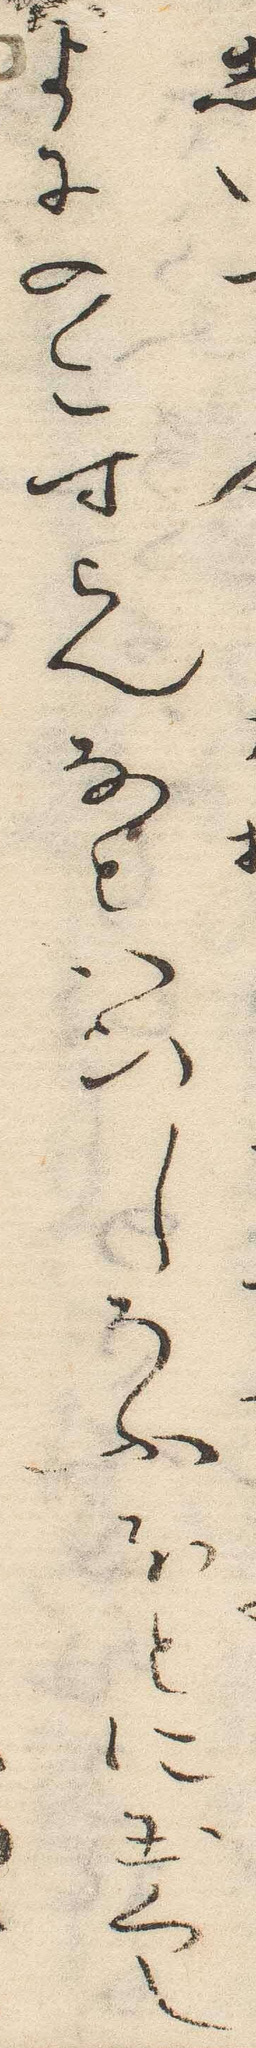よにのこすらんなといひしろふほとに玉くし
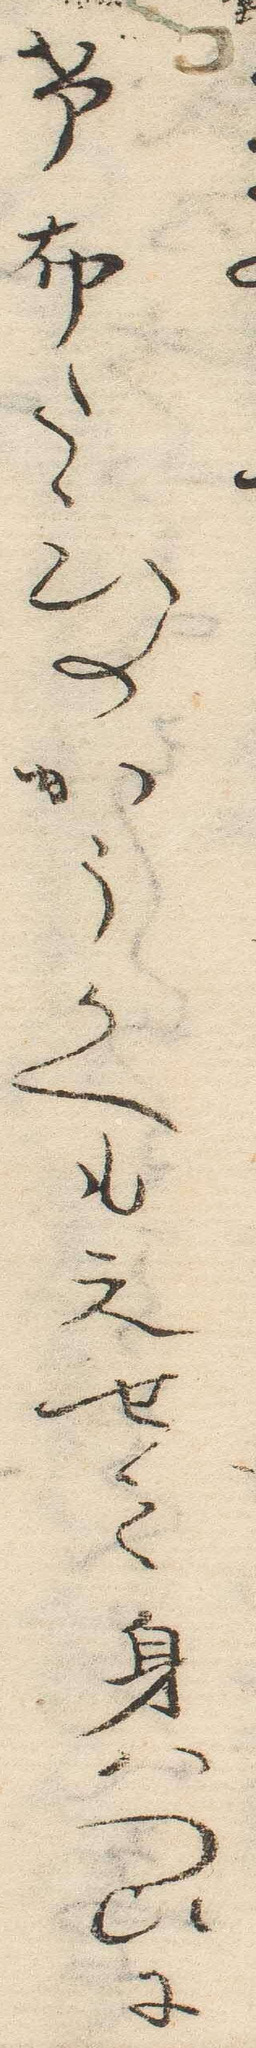けふたゝひのかうかへもえせて身はつひに
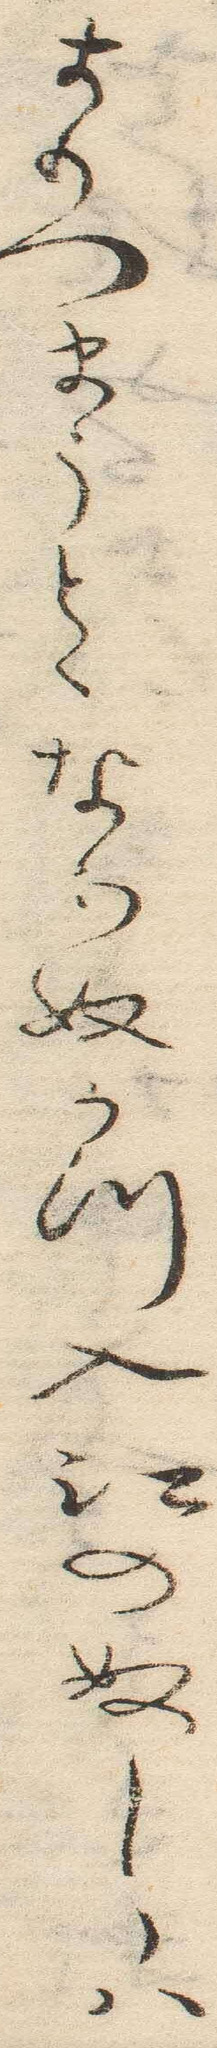よもつまうとゝなりぬかつ入江のぬしは
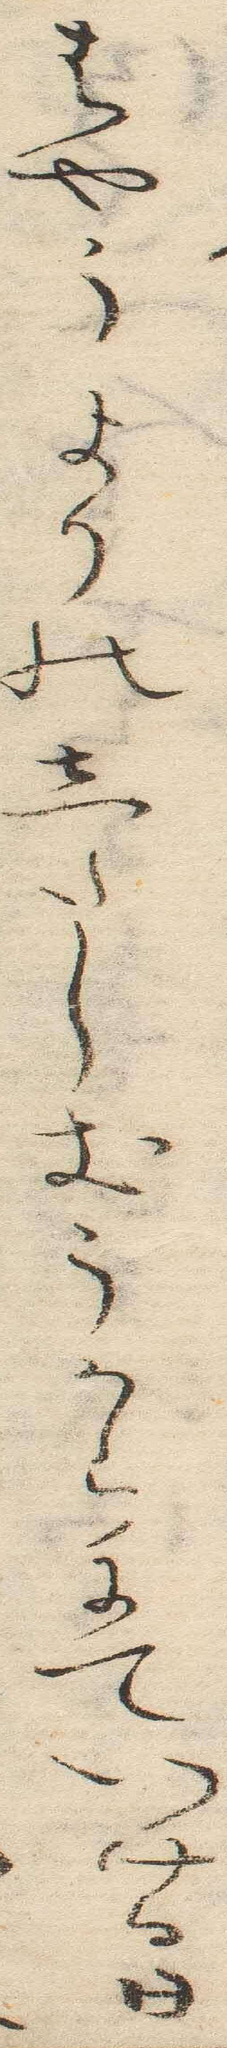はやうよりのしたしきうからにていける日
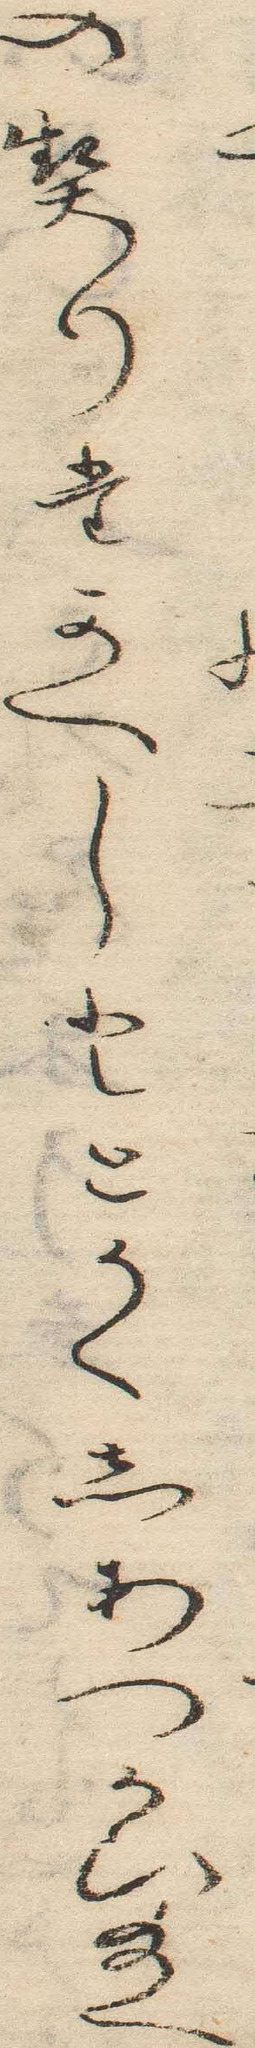の契りたかへしととかくしあつかひ給へ
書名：竹取物語
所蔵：東京学芸大学附属図書館 国文学研究資料館
